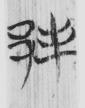邦
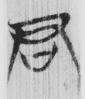君
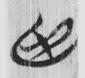臣
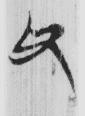父
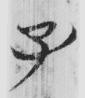子
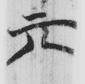亓
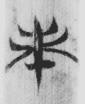未
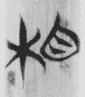相
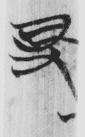𠭁
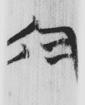今
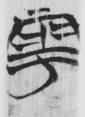𩁹
